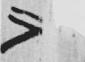之
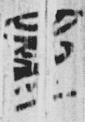童
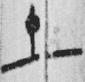土
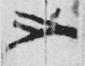之
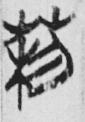莉（黎）
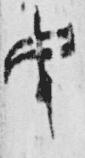民
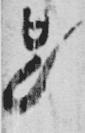也
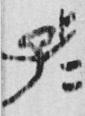孔子
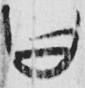曰
